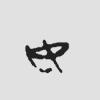女
